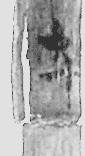{十七}
